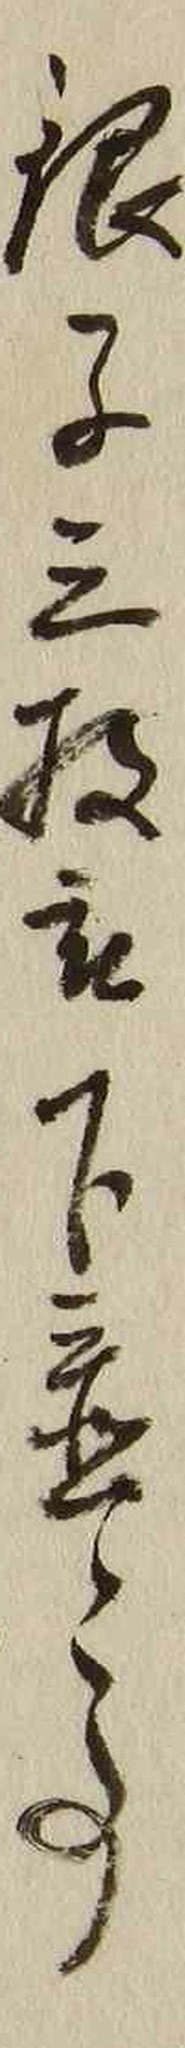銀子三枚被下置候事
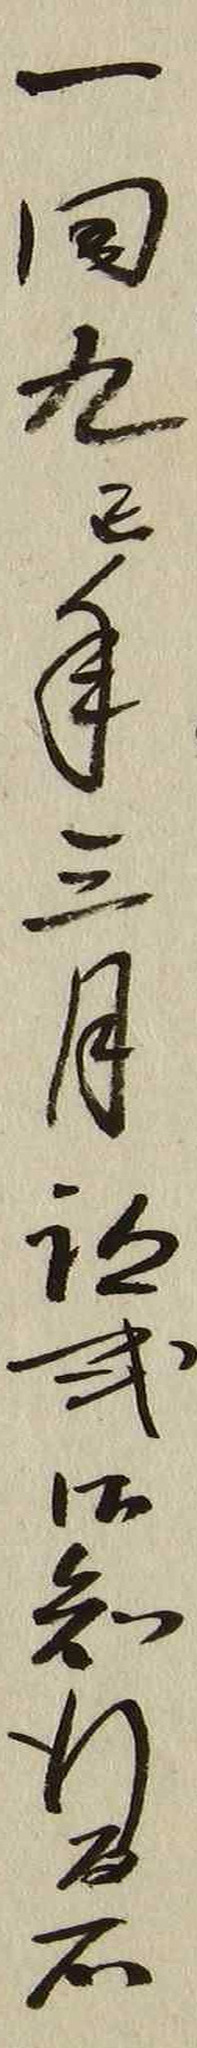一同九巳年三月跡式御知行百石
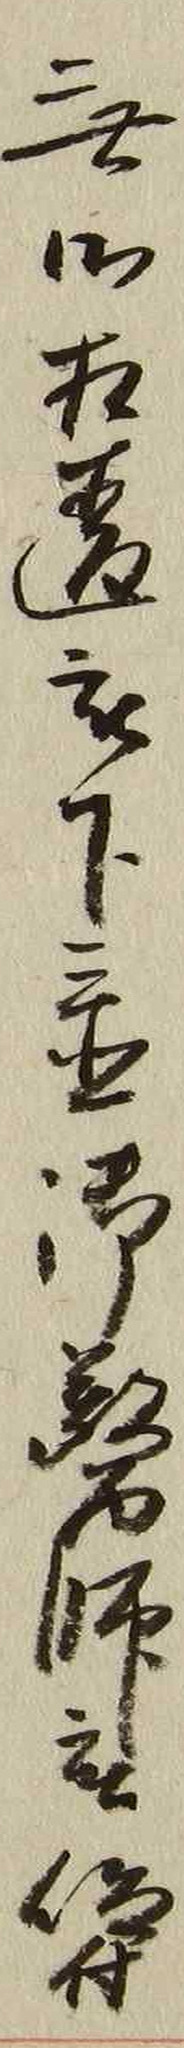無御相違被下置御医師被仰付
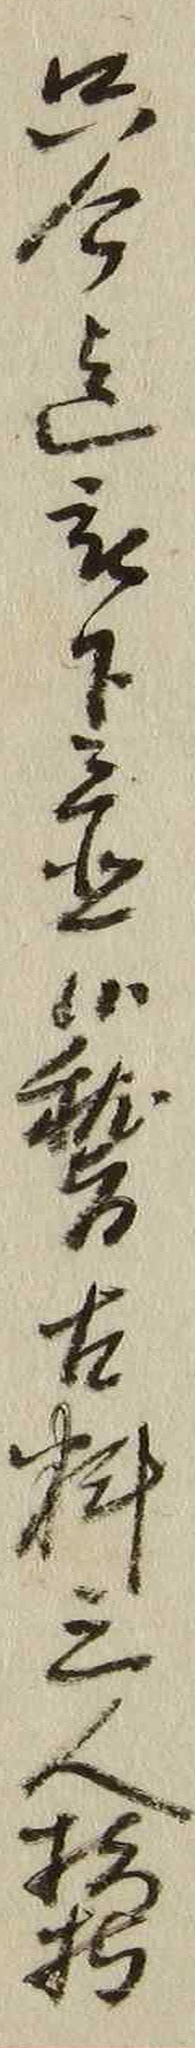只今迄被下置候稽古料三人扶持
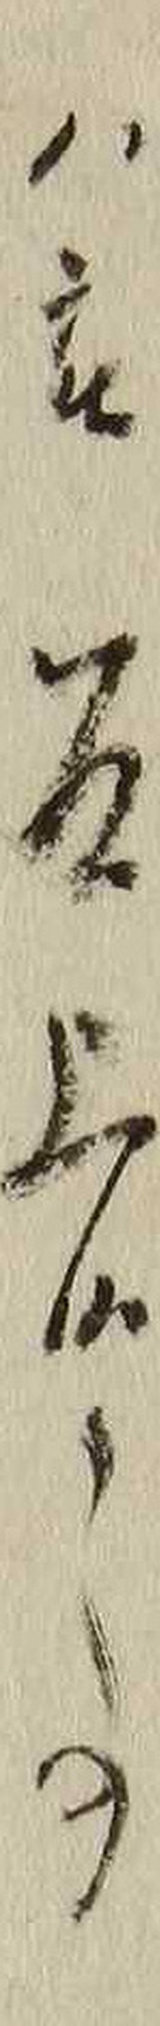ハ被召上候事
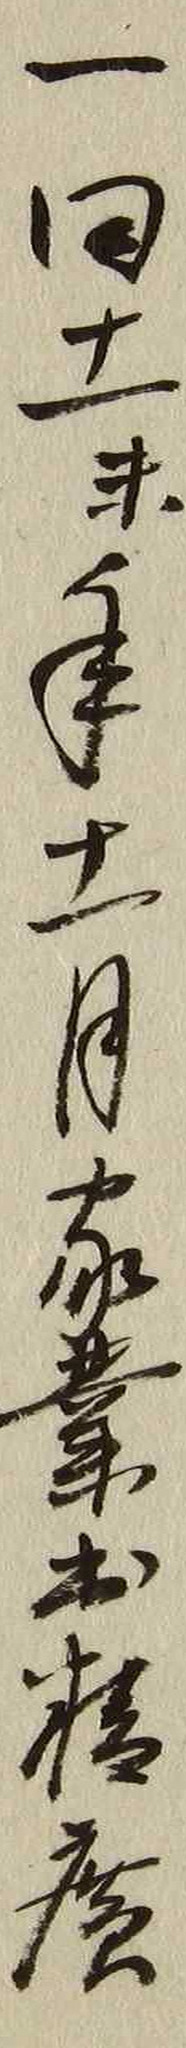一同十一未年十一月家業出精広
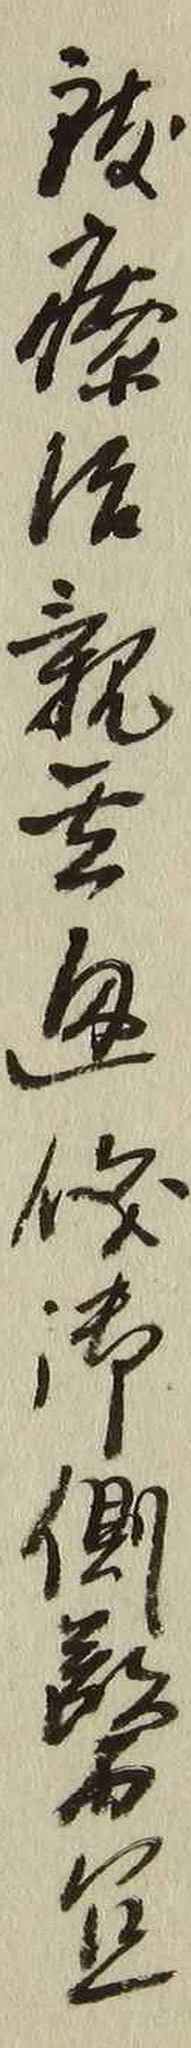致療治親玄通儀御側医宜
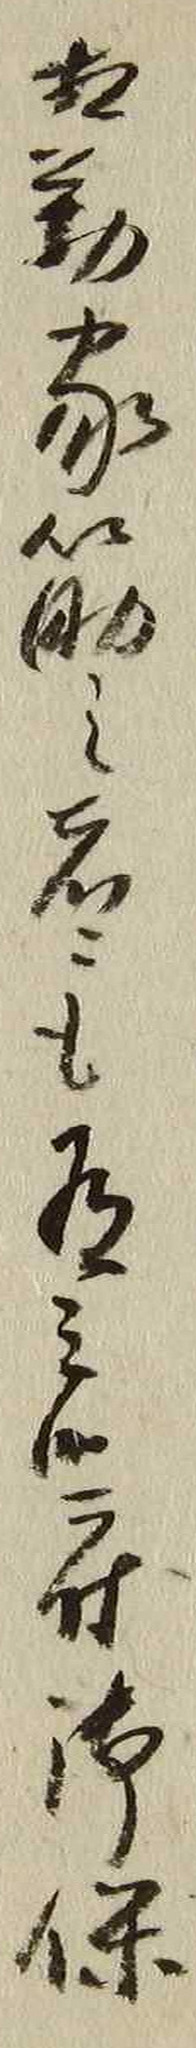相勤家筋之者ニも有之候ニ付御保
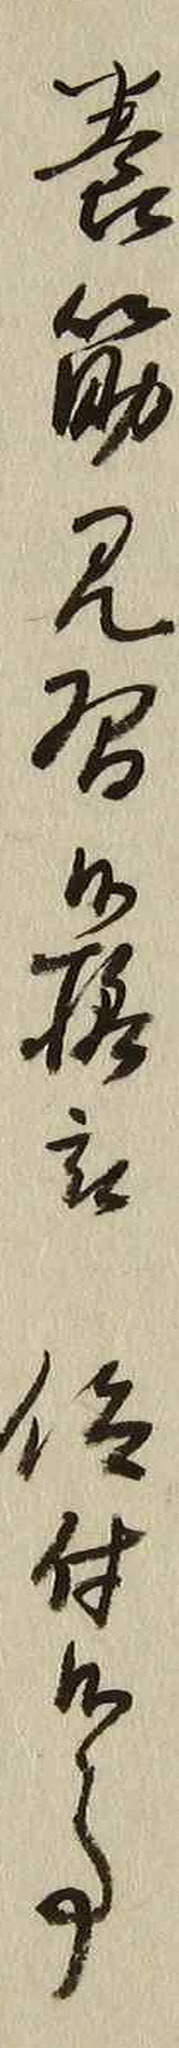養筋見習候様被仰付候事
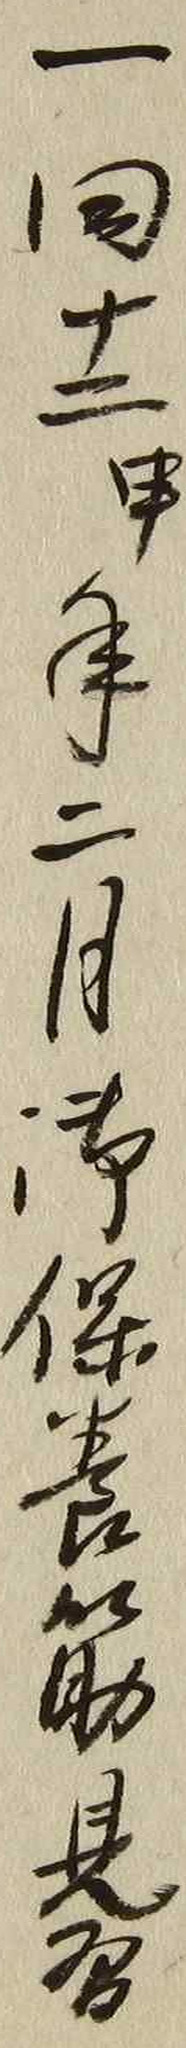一同十二申年二月御保養筋見習
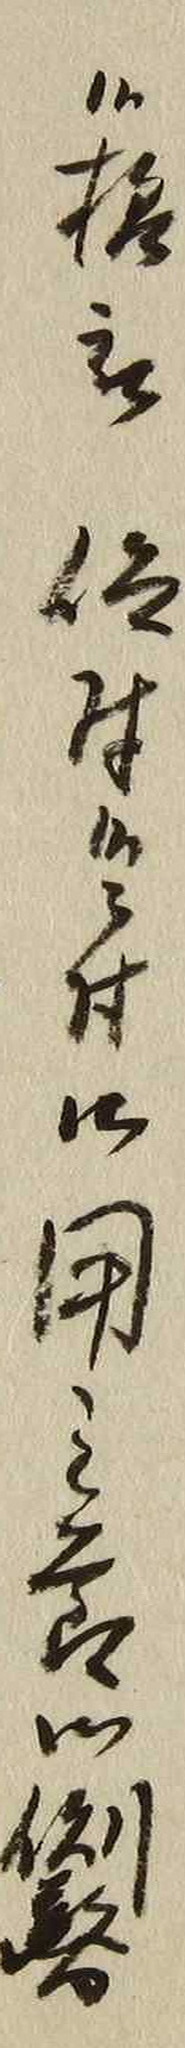候様被仰付候ニ付御用之節側医
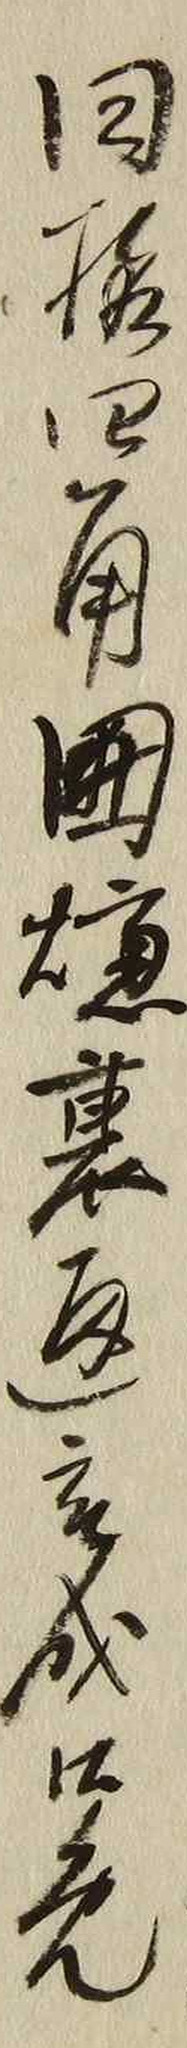同様四角囲炉裏通被成御免
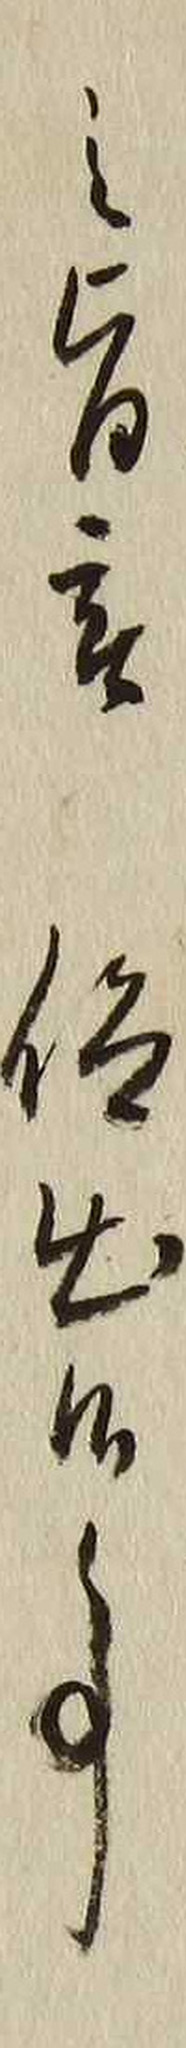之旨被仰出候事
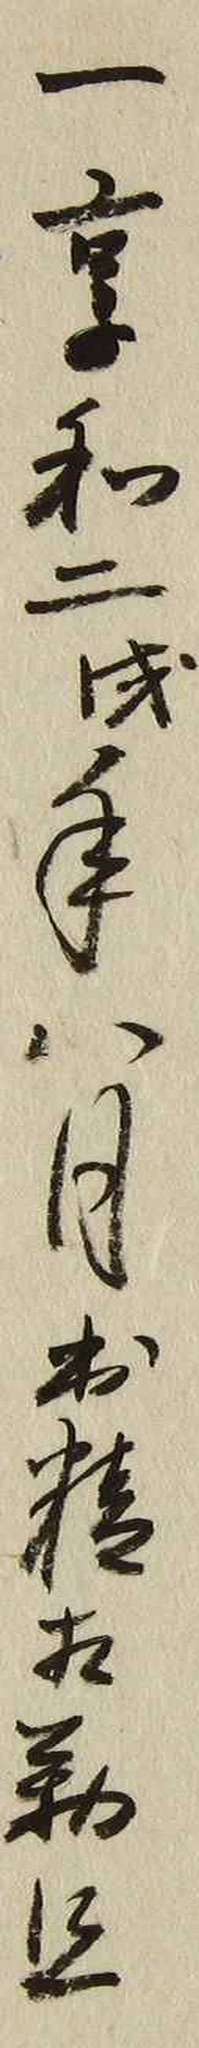一享和二戌年八月出精相勤且
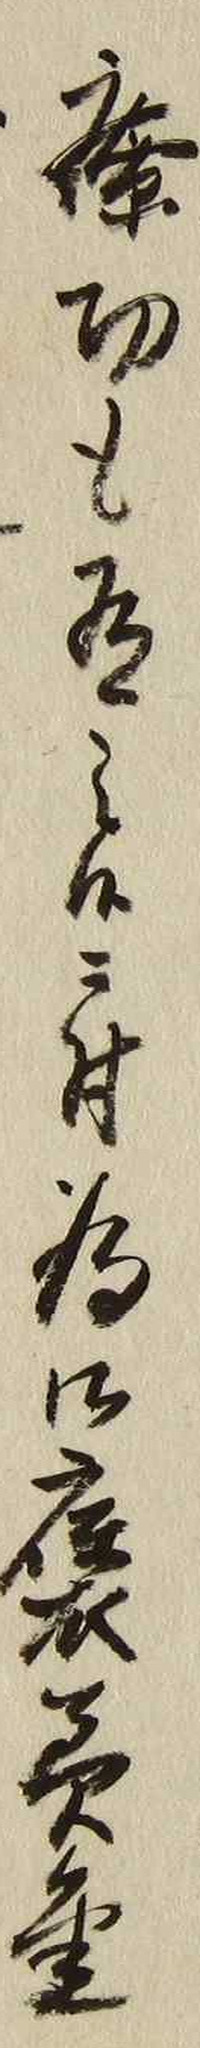療切も有之候ニ付為御褒美金
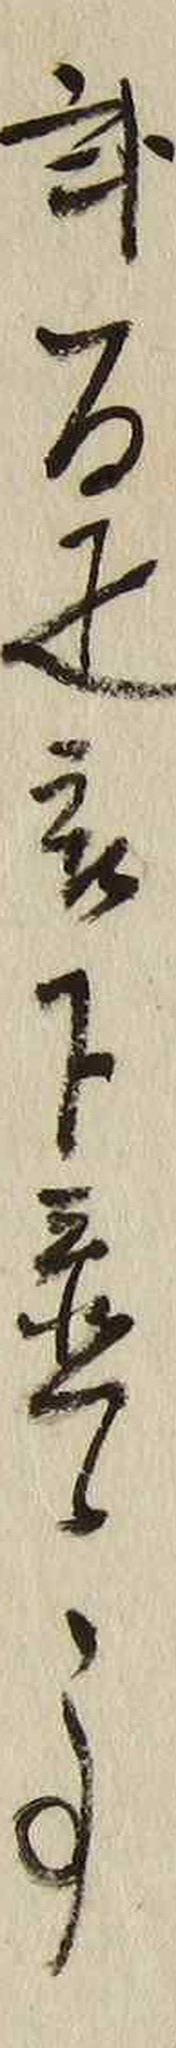弐百疋被下置候事
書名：諸士系譜　巻之353　す之部3
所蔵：会津若松市立会津図書館
